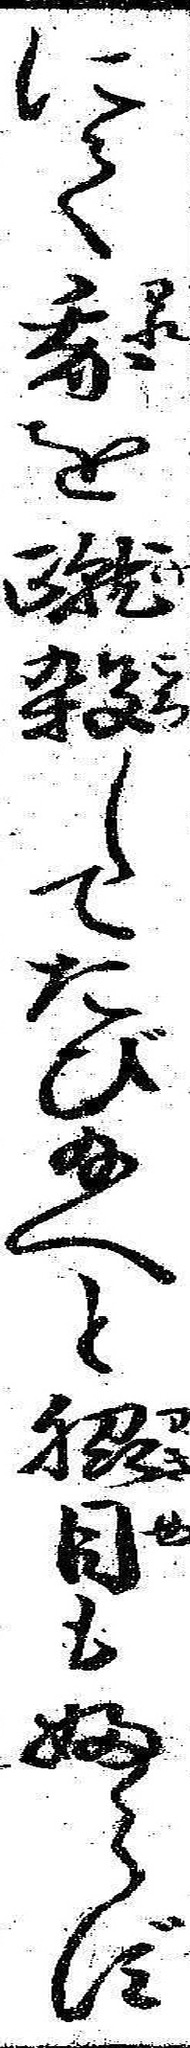にて我を蹴殺してたび給へと脇目もふらず
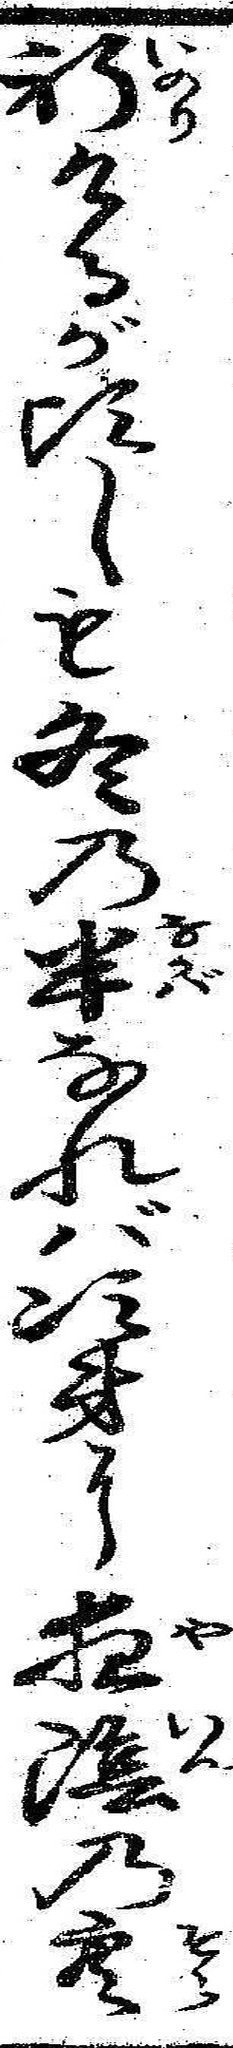祈けるが頃しも冬の半なれば次第に夜陰の空
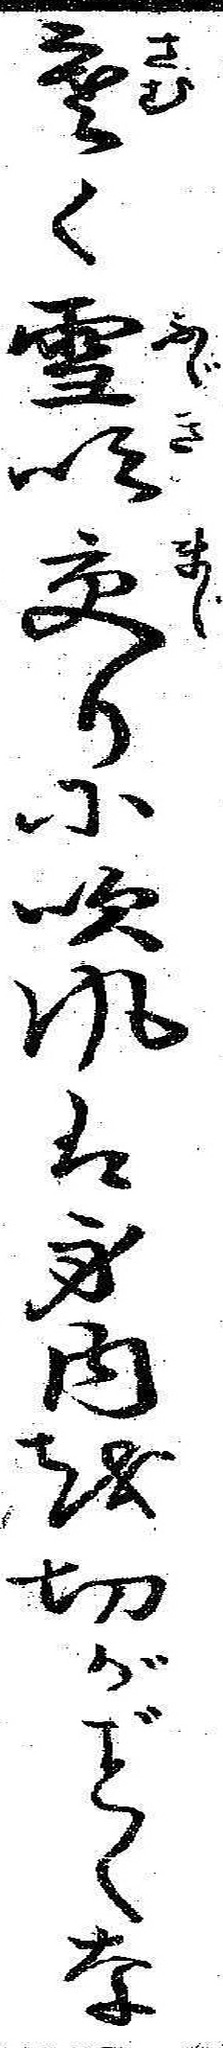寒く雪吹交りに吹風は身内を切がごとくな
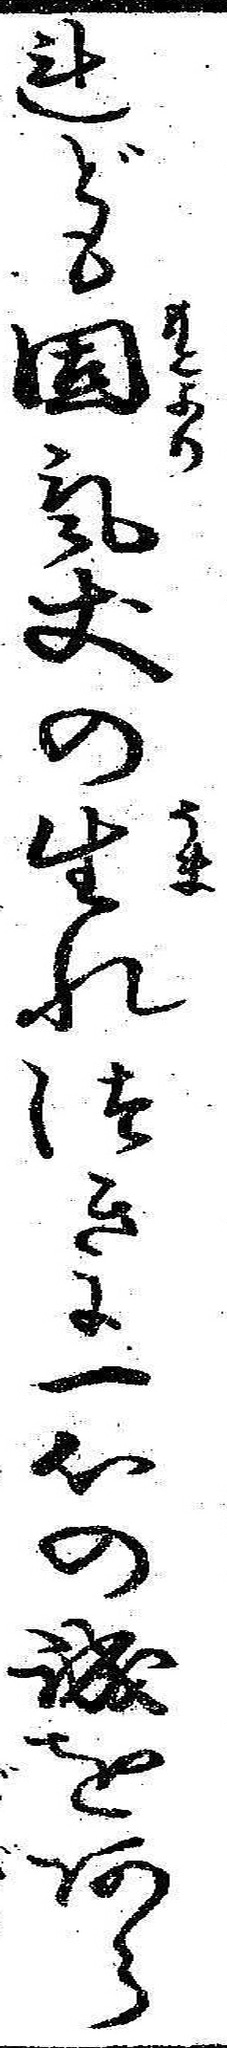れども固気丈の生れつきに一心の誠をあら
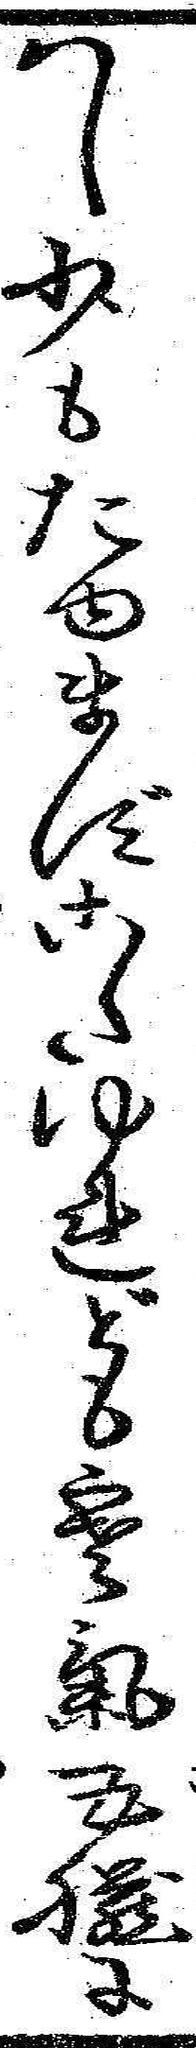はし少もたゆまずこたゆれども寒気五臓に
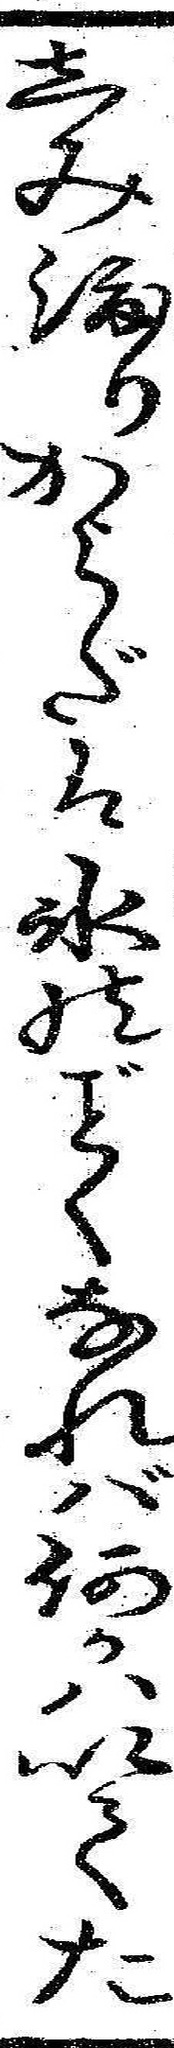しみ渡りからだは氷のごとくなれば何かは以てた
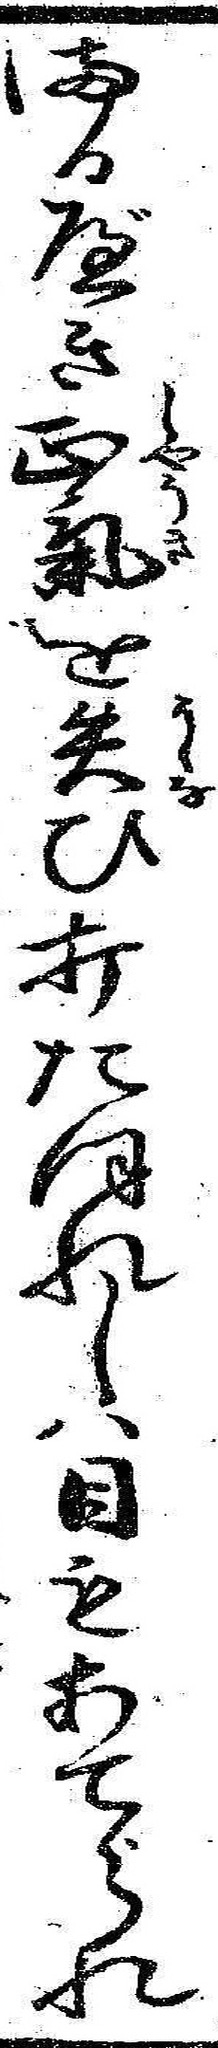まるべき正気を失ひ打たほれしは目もあてられ
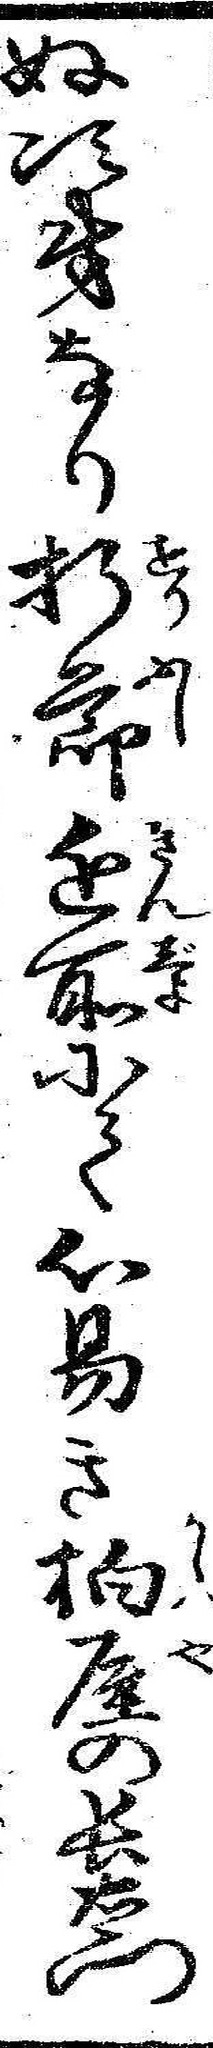ぬ次第なり折節近所にて心易き柏屋の長右衛門
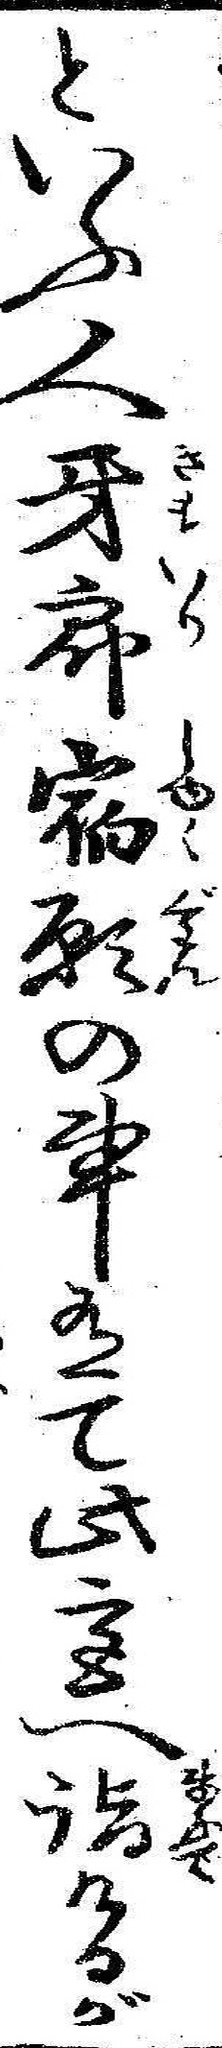といふ人牙郎宿願の事有て此宮へ詣けるが
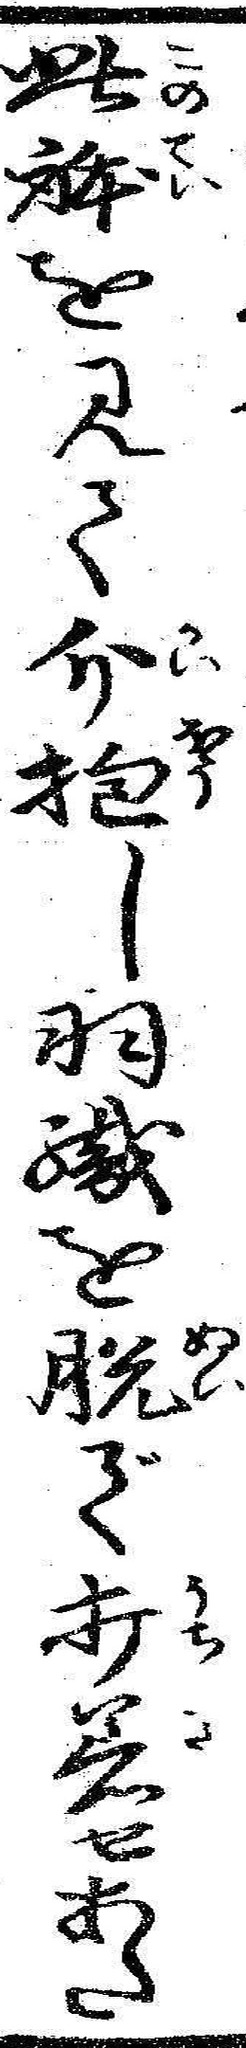此体を見て介抱し羽織を脱で打着せあた
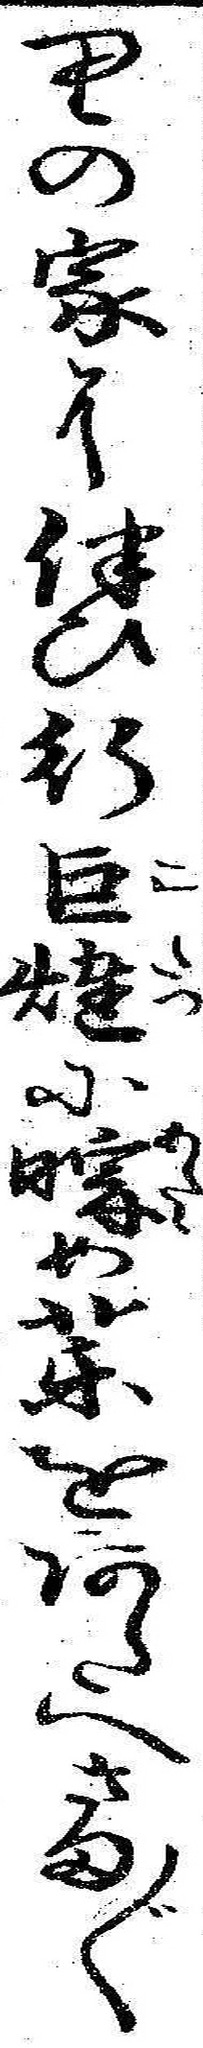りの家に伴ひ行巨燵に暖め薬をあたへさま〴〵
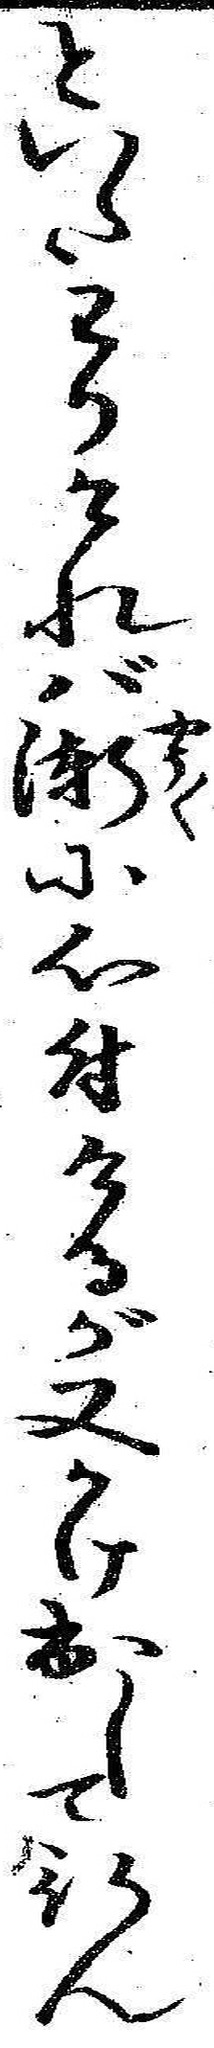といたわりければ漸に心付けるが又かけ出して行ん
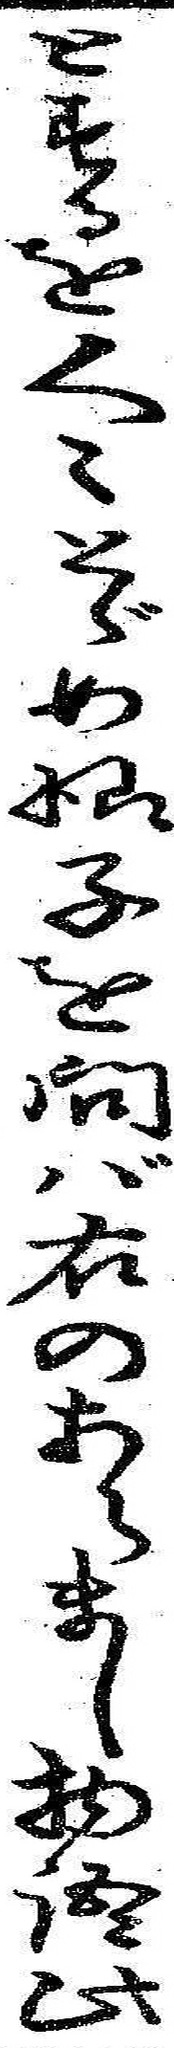とするを人々とゞめ様子を問ば右のあらまし物語此
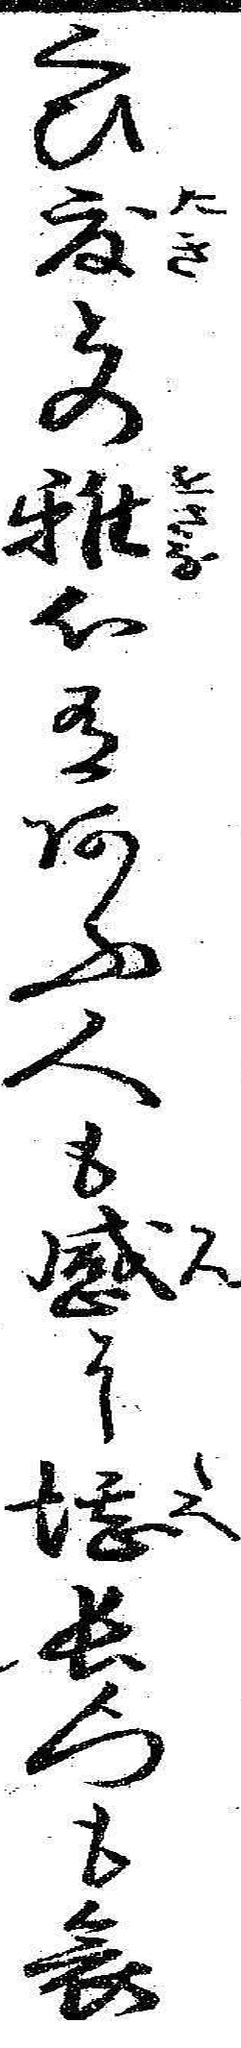くひ度との稚心有あふ人も感に堪長右衛門も哀
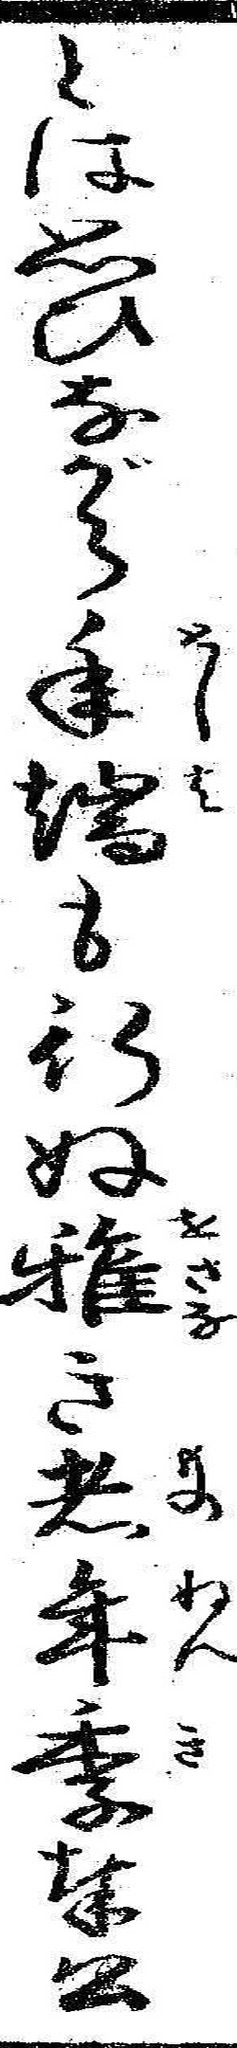とは思ひながら年端も行ぬ稚き者年季奉公
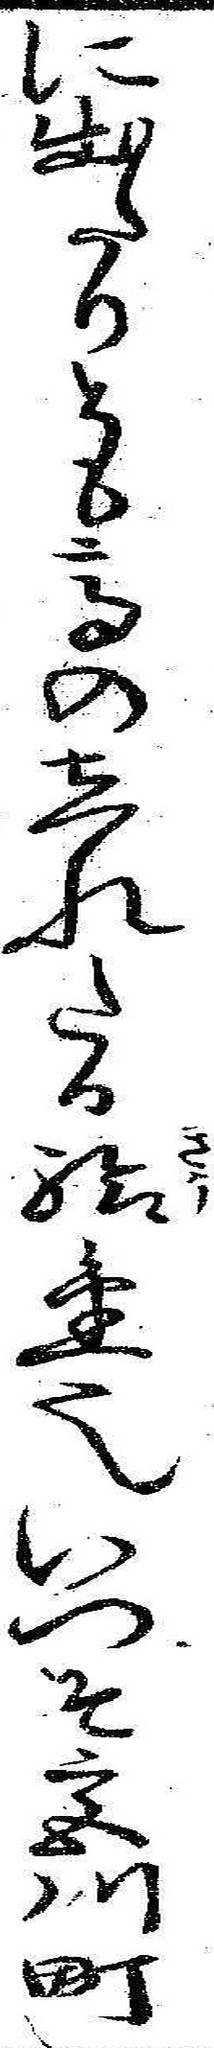に出たりとも高のしれたる給金也いつそ宮川町
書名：根無草後編
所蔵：国文学研究資料館
